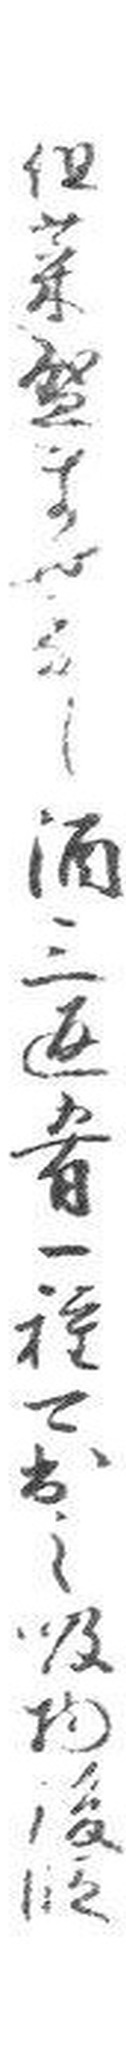但菜盛まなし酒三返肴一種可出之吸物後段
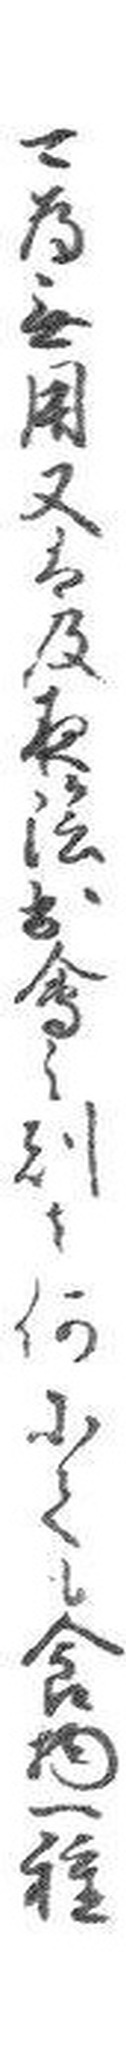可為無用又は及夜陰出会之刻者何にても食物一種
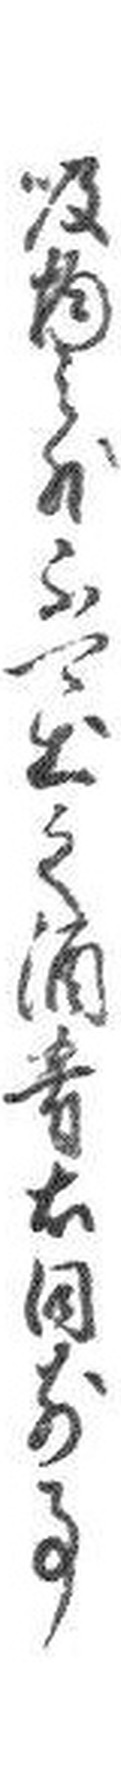吸物之外不可出之酒肴右同前事
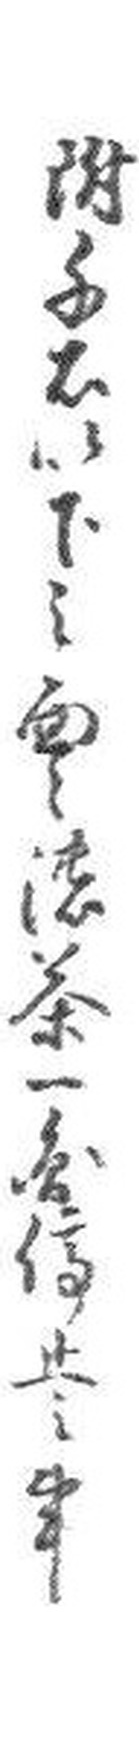附千石以下之面々濃茶一円停止之事
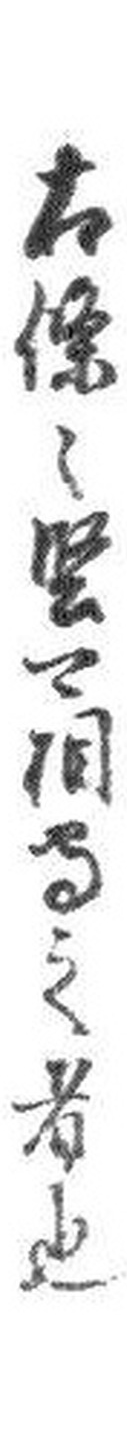右条々堅可相守之者也
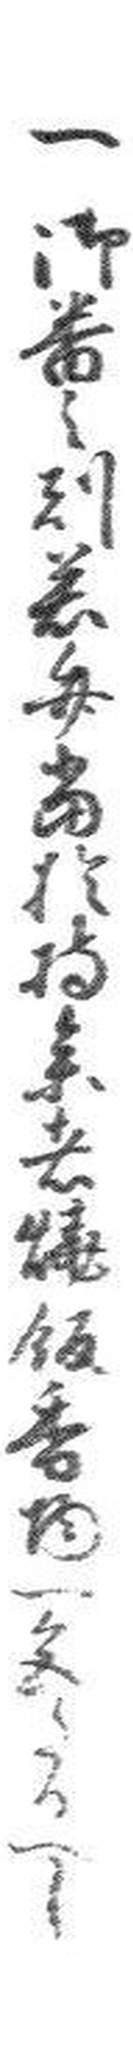一御番之刻若弁当於持参者焼飯香物一色たるへし
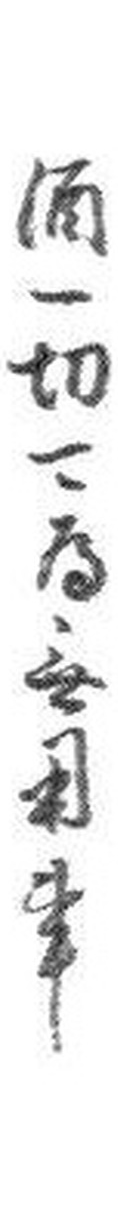酒一切可為無用事
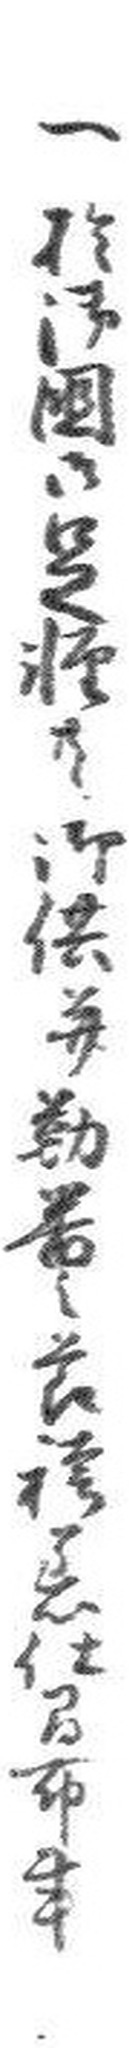一於御国御足軽共御供并勤番之節袴着仕間布事
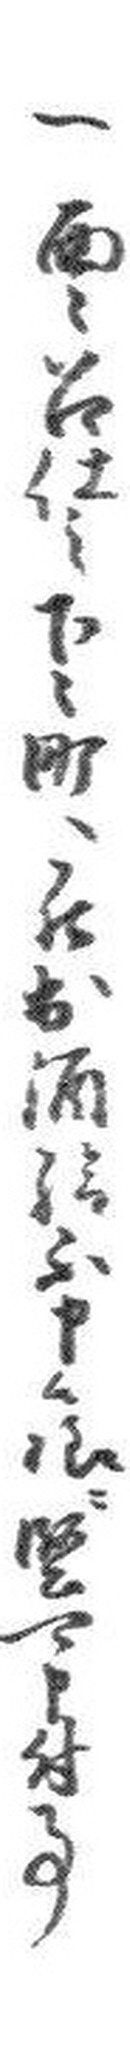一面々召仕之下々町へ罷出酒給不申候様ニ堅可申付事

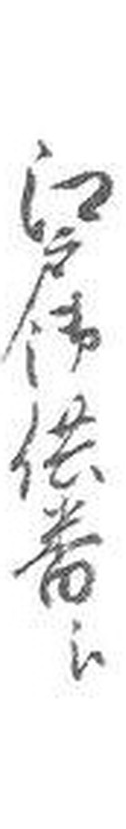江戸御供番江
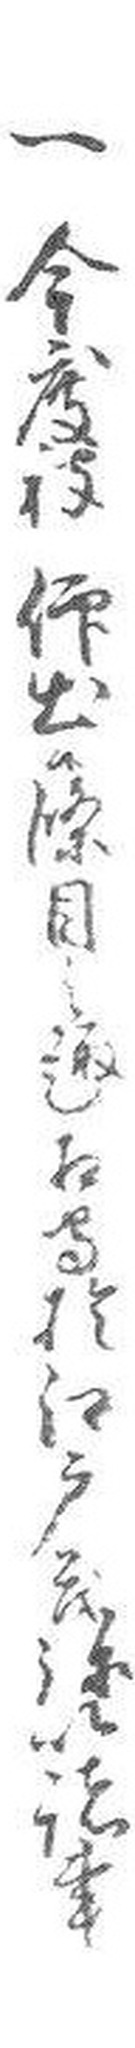一今度被仰出候条目之趣相守於江戸も弥以諸事
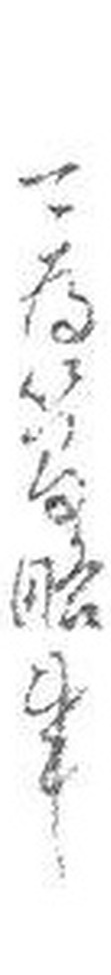可為簡略事
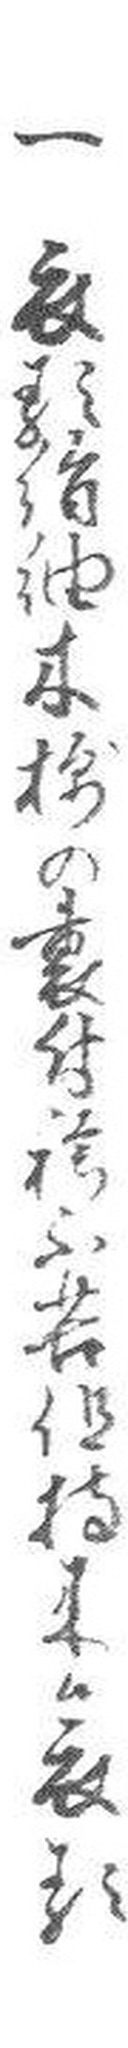一衣類絹紬木綿の裏付袴不苦但持来候衣類
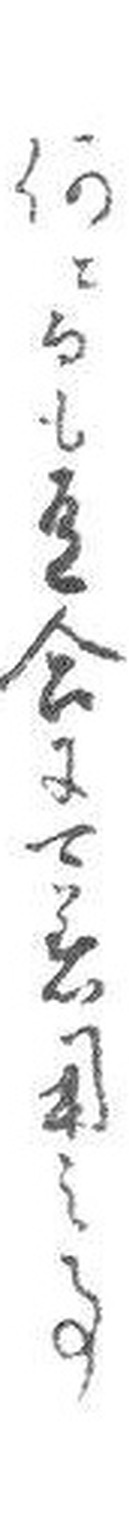何ニ而も有合にて着用之事
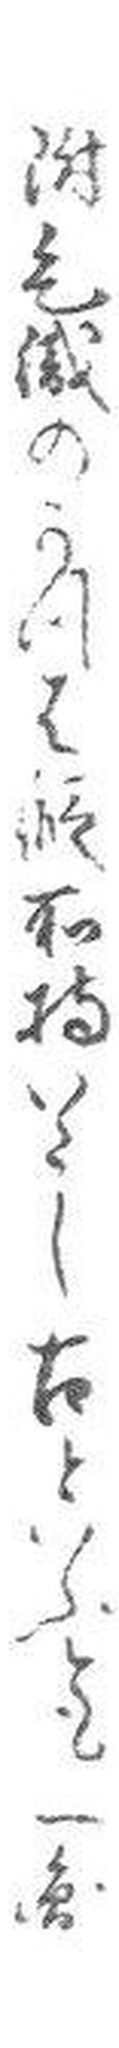附毛織のかつは縦所持いたし古といふとも一円
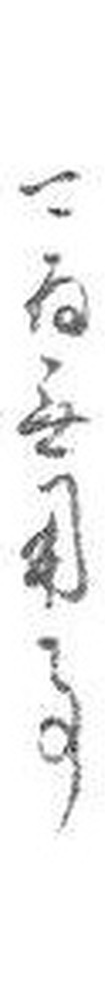可為無用事
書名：家譜 七 光通公 従寛文四年到同九年
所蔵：福井県文書館 Fukui Prefectural Archives
